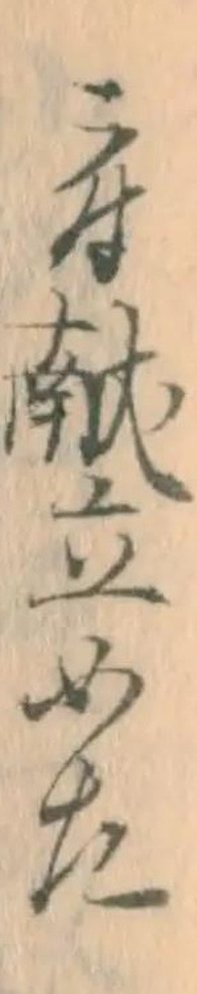ニ付献立如左
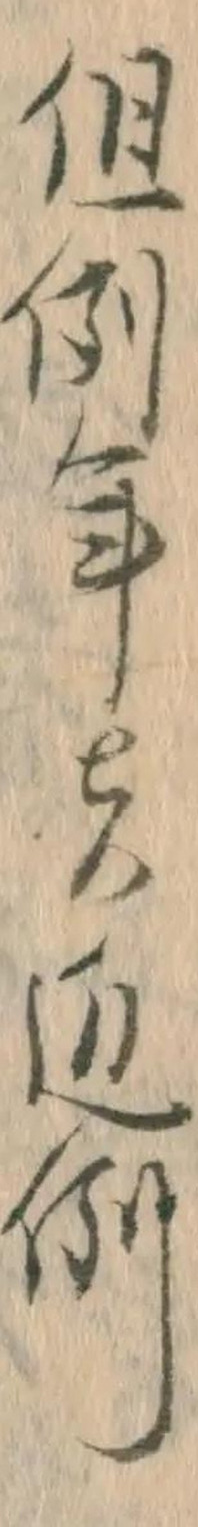但例年は辺例

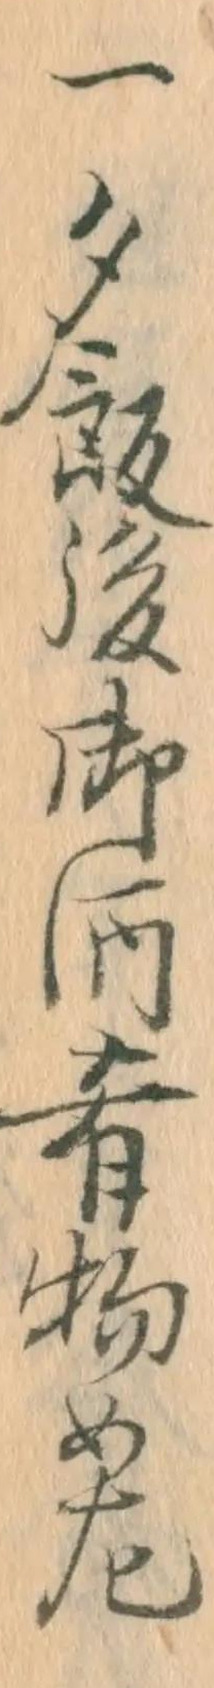一夕飯後御酒肴物如左
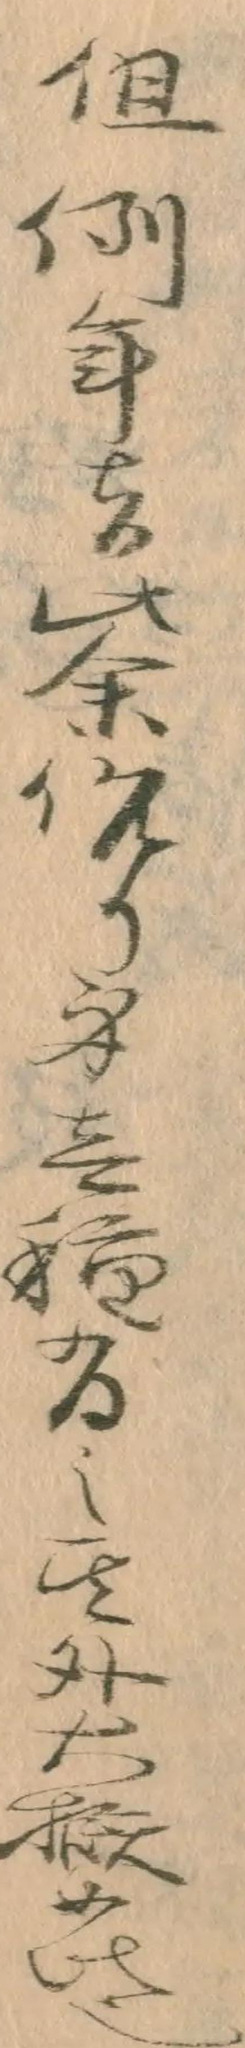但例年者此余作り身壱種有之其外大概如此也
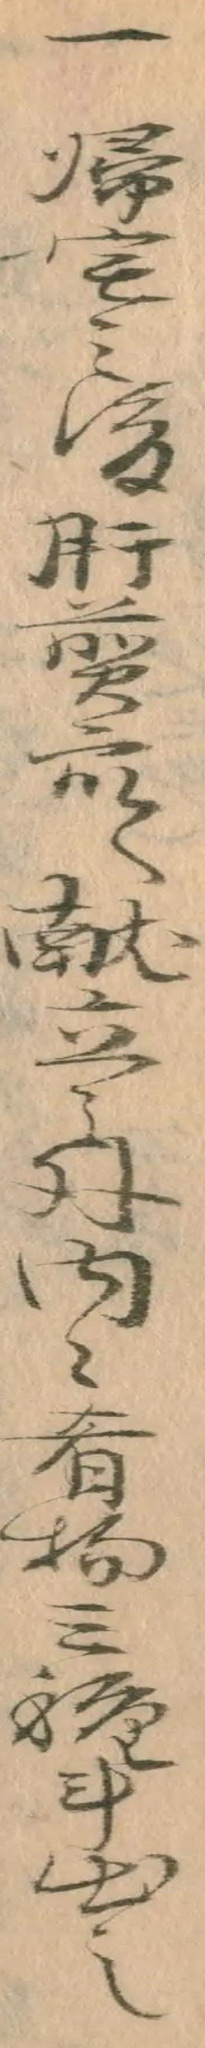一帰宅之後肝煎衆へ献立之外内々肴物三種斗出之
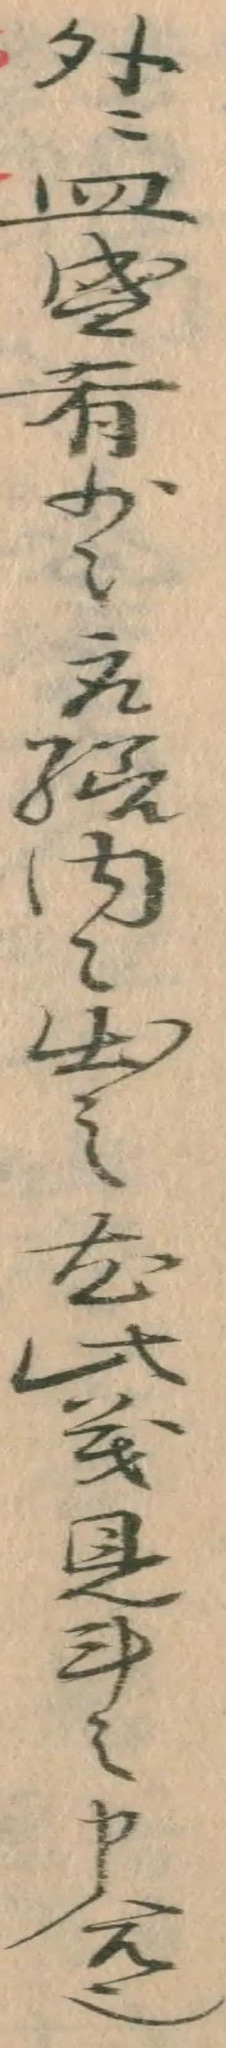外二皿盛肴少々取繕内々出也尤此義見斗之申合也
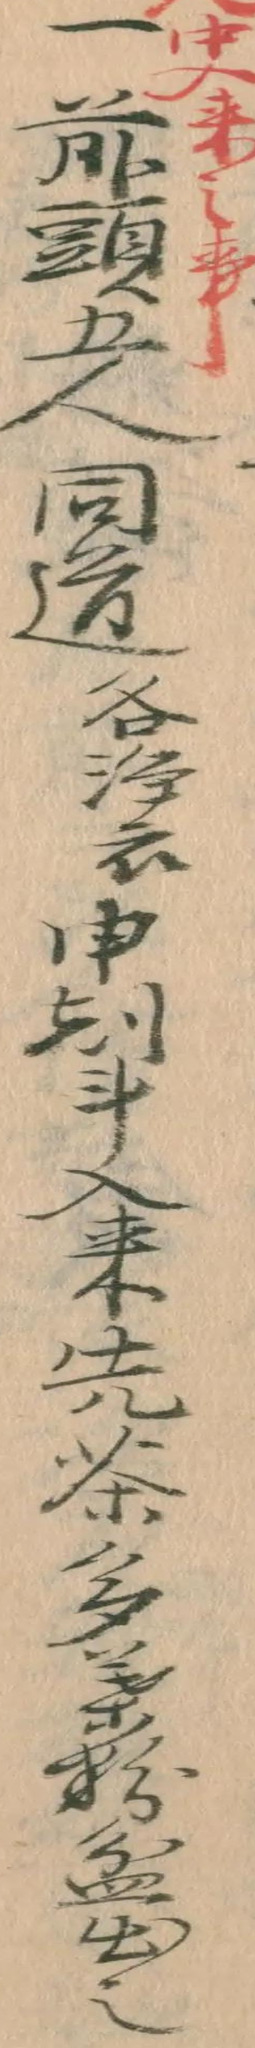一前頭五人同道各浄衣申刻斗入来先茶多葉粉盆出之
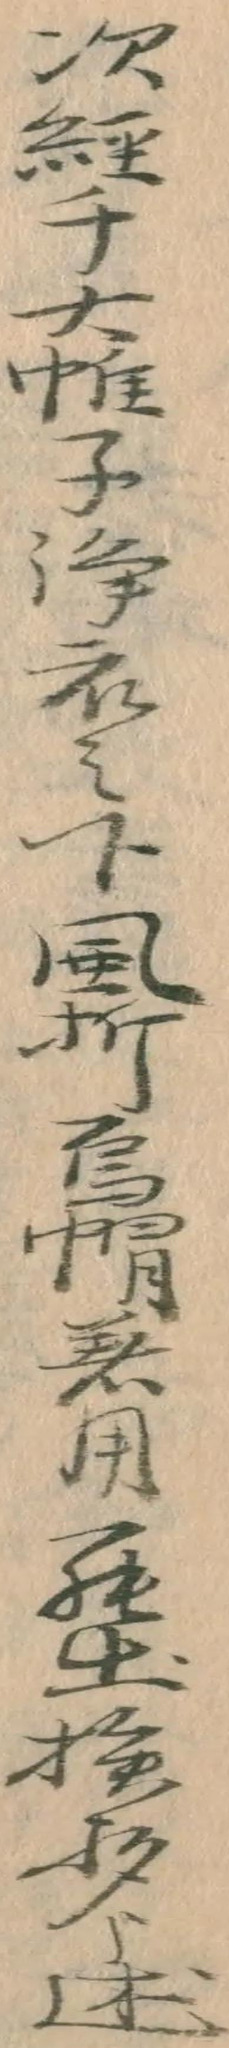次経千大帷子浄衣之下風折烏帽着用罷出挨拶申述
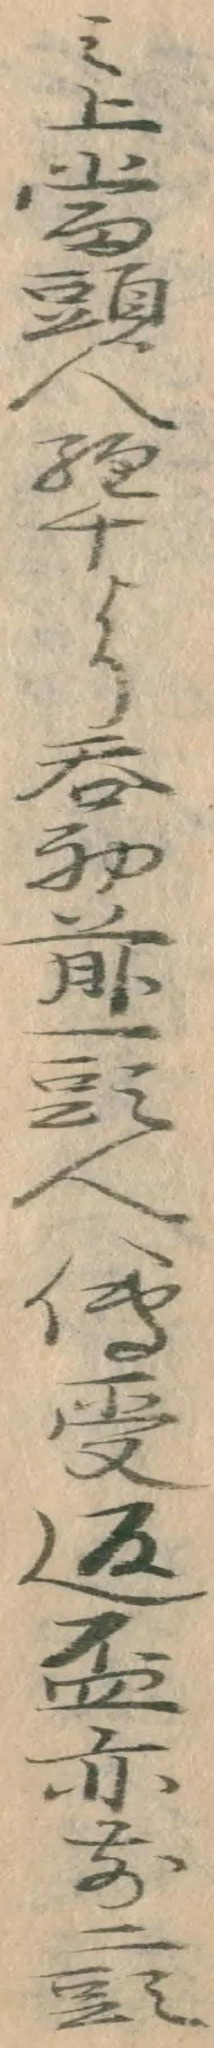之上當頭人経千より呑初前一頭人傳授返盃亦前二頭
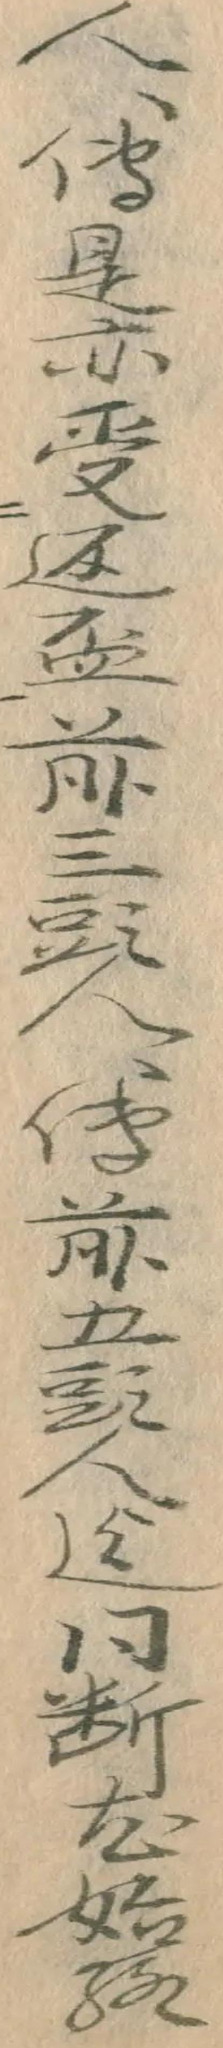人へ傳是亦受返盃前三頭人へ傳前五頭人迄同断尤始終
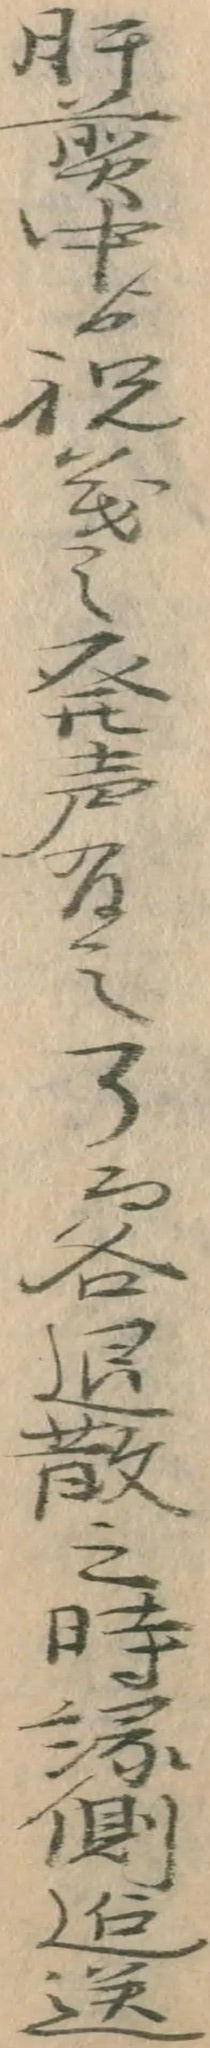肝煎中ゟ祝義之発声有之了而各退散之時縁側迄送

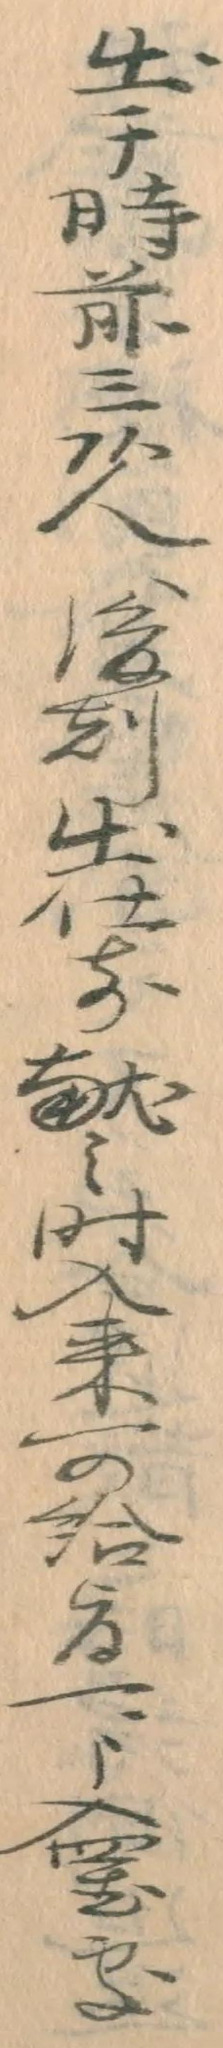出于時前三頭人へ後刻出仕前献之時入来可給旨可申入置處
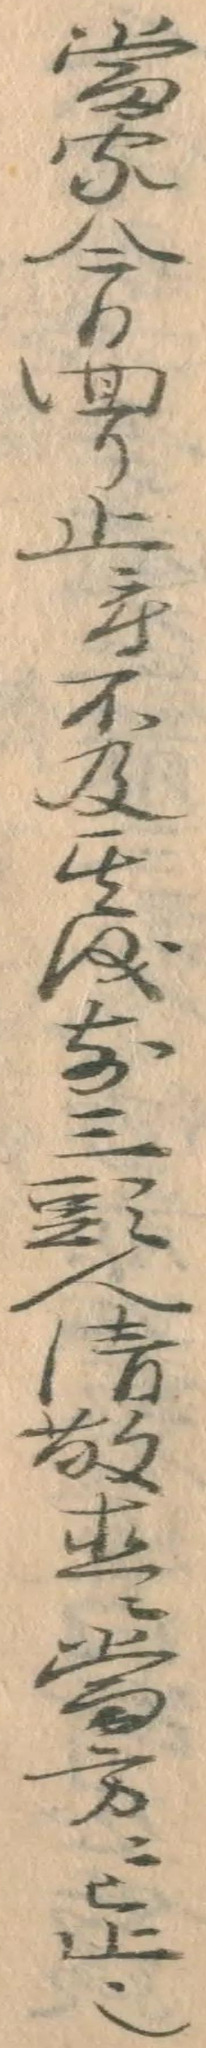當家今日回り止ニ付不及其儀前三頭人清敬直ニ當方ニ被止也
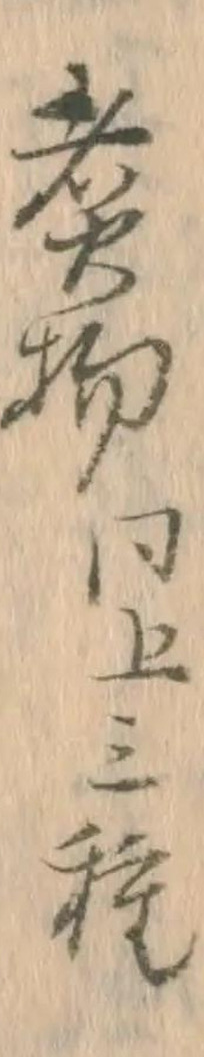煮物同上三種
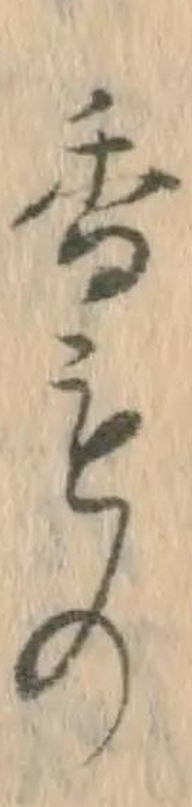香もの
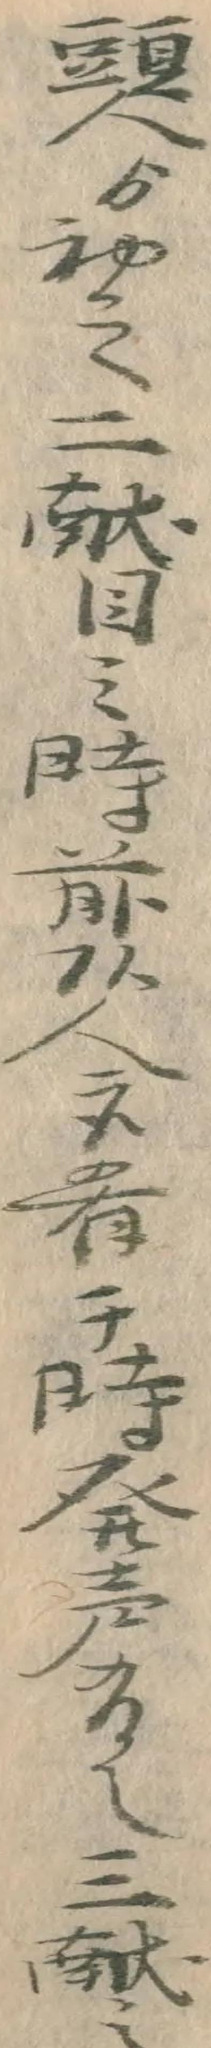頭人ゟ初之二献目之時前頭人取肴于時発声有之三献之
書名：賀茂社記録. 第72冊
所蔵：国立国会図書館 National Diet Library, JAPAN
